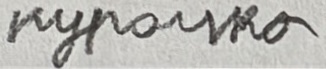курочка
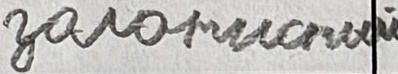залотистый
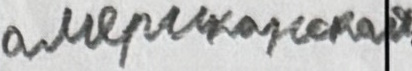американская
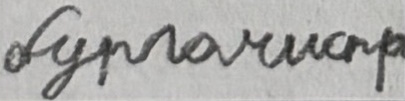бургомистр
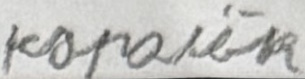королёк
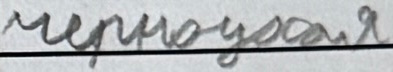черноухая
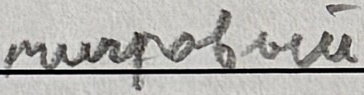тигровый
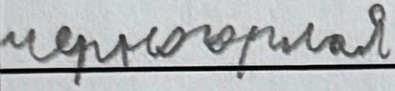черногорлая
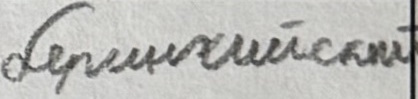берингийский
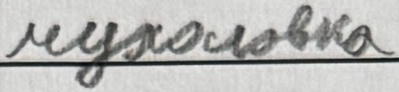мухоловка
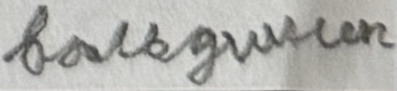вальдшнеп
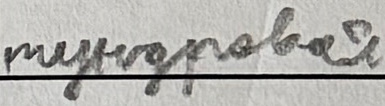тундровая
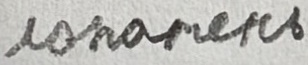лопатень
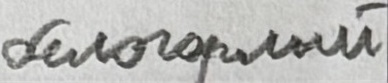белогорлый
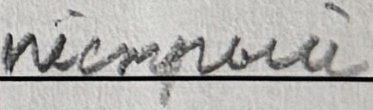пёстрый
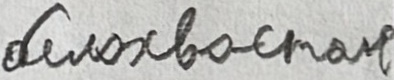белохвостая
